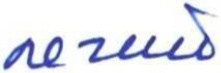пегий
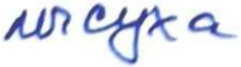лысуха
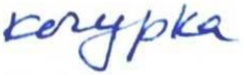кочурка
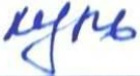лунь
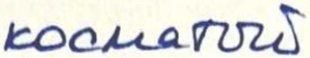косматый
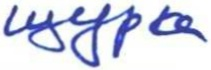щурка
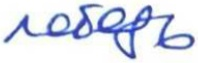лебедь
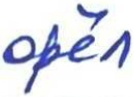орёл
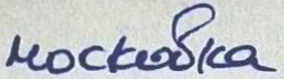московка
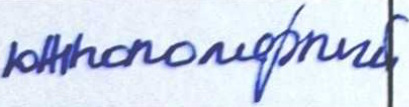южнополярный
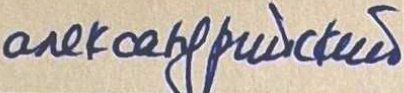александрийский
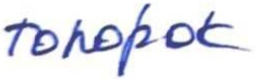топорок
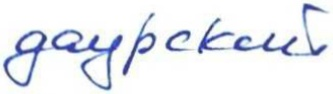даурский
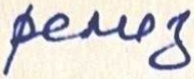ремез
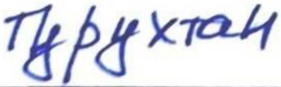турухтан
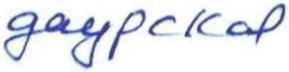даурская
